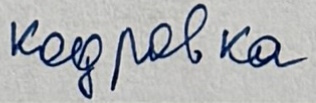кедровка
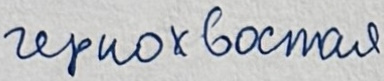чернохвостая
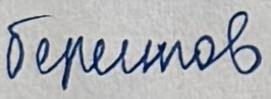берингов
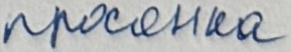просянка
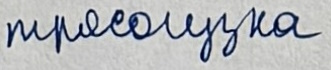трясогузка
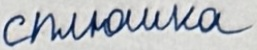сплюшка
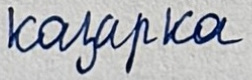казарка
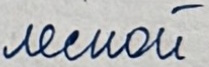лесной
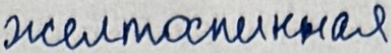желтоспинная
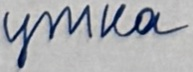утка
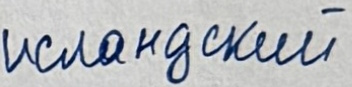исландский
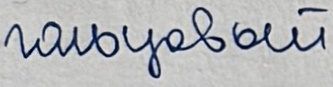гальцовый
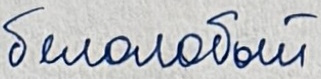белолобый
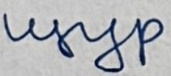щур
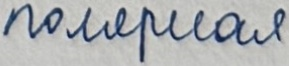полярная
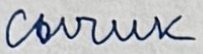сычик
